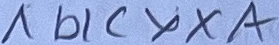лысуха
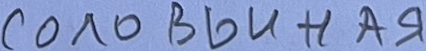соловьиная
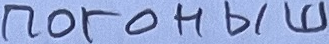погоныш
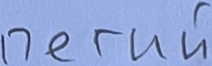пегий
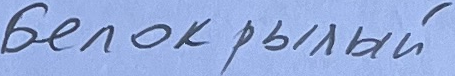белокрылый
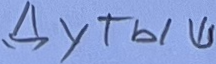дутыш
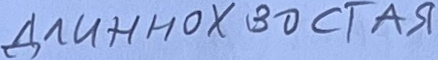длиннохвостая
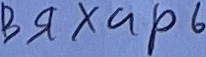вяхирь
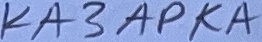казарка
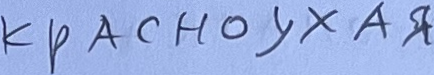красноухая
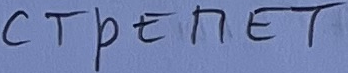стрепет
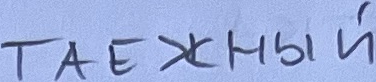таежный
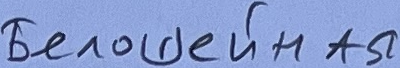белошейная
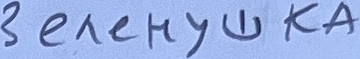зеленушка
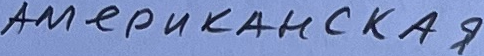американская
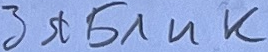зяблик
